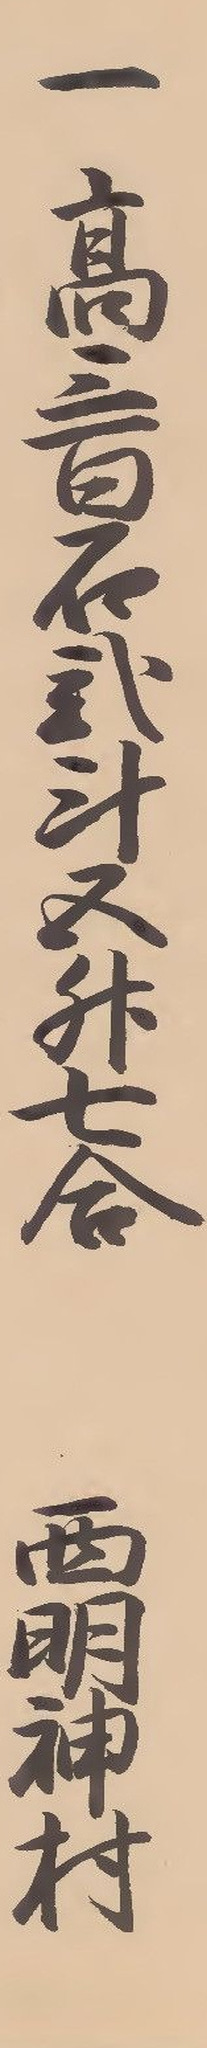一高三百石弐斗五升七合西明神村
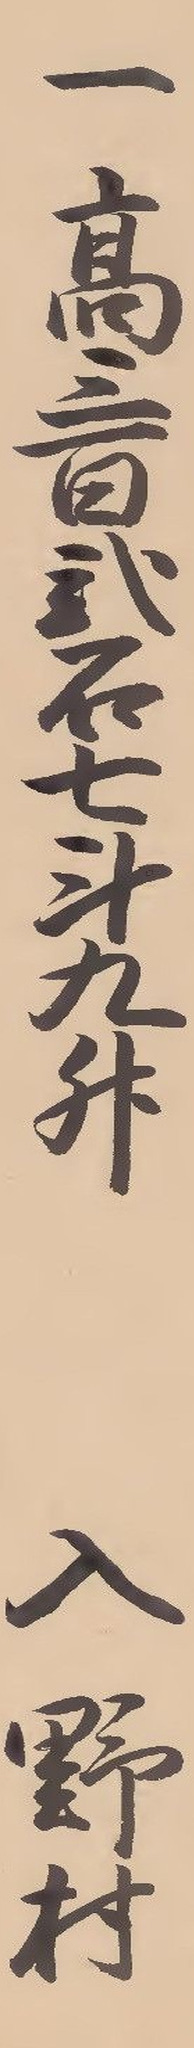一高三百弐石七斗九升入野村
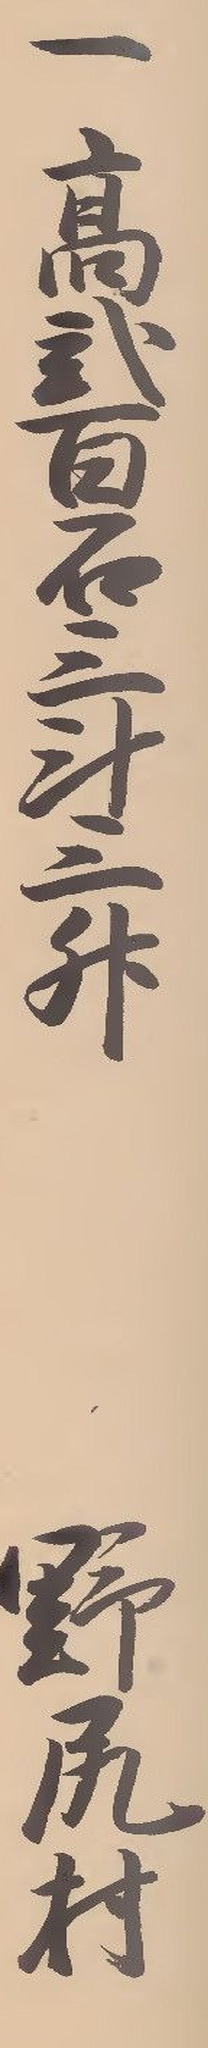一高弐百石三斗三升野尻村
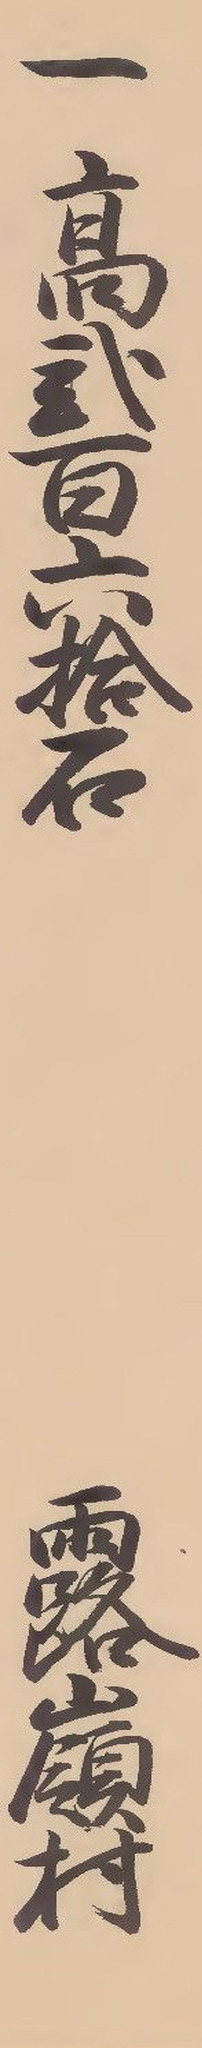一高弐百六拾石露嶺村
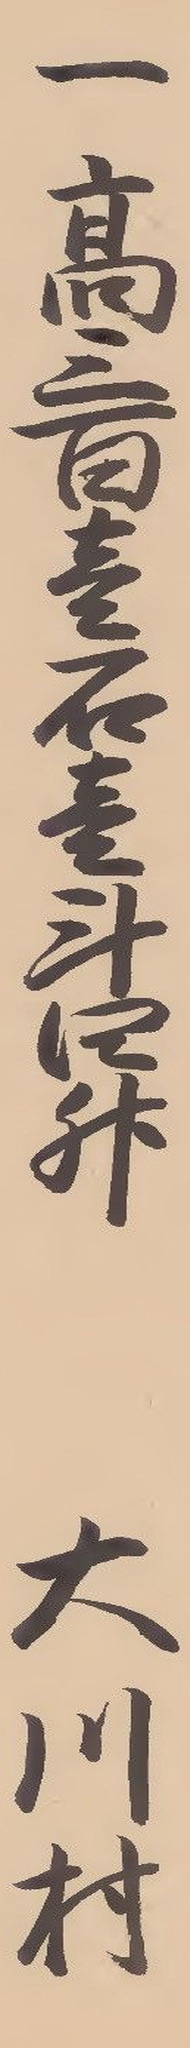一高三百壱石壱斗四升大川村
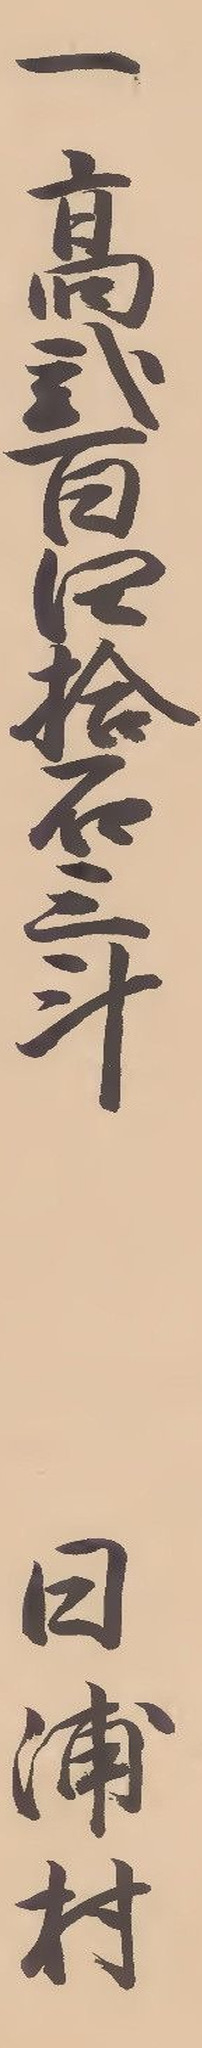一高弐百四拾石三斗日浦村

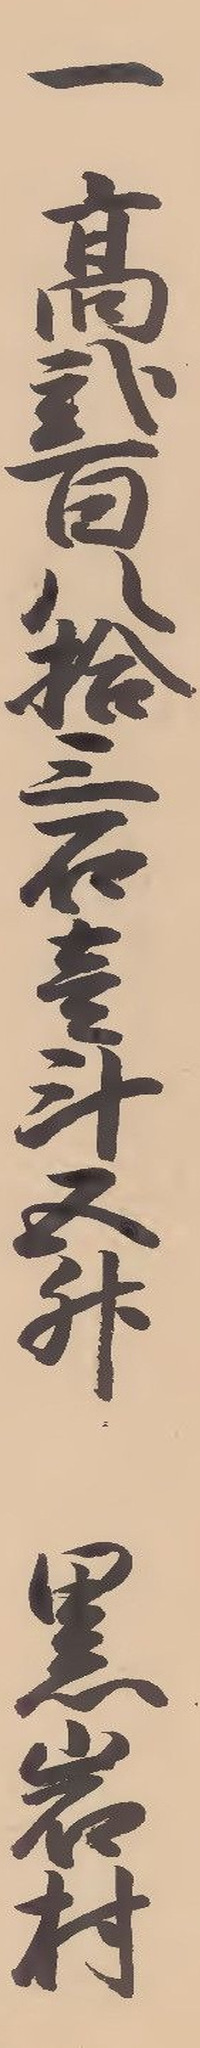一高弐百八拾三石壱斗五升黒岩村
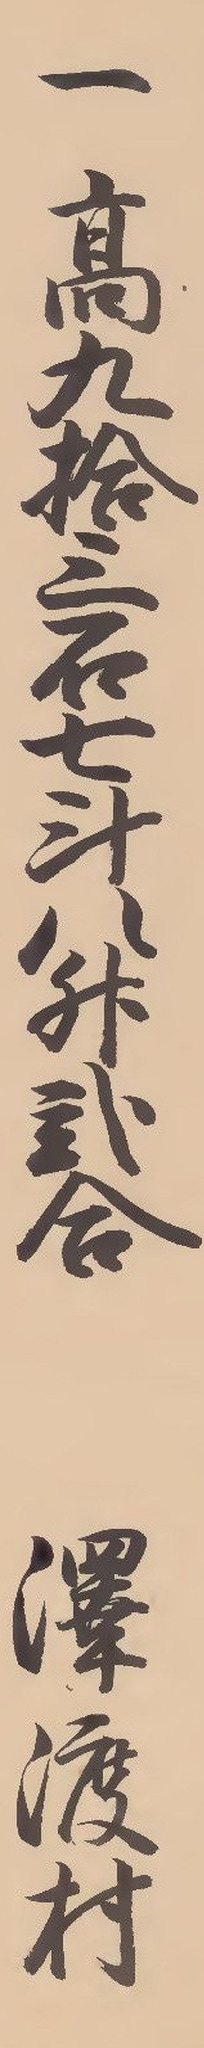一高九拾三石七斗八升弐合沢渡村
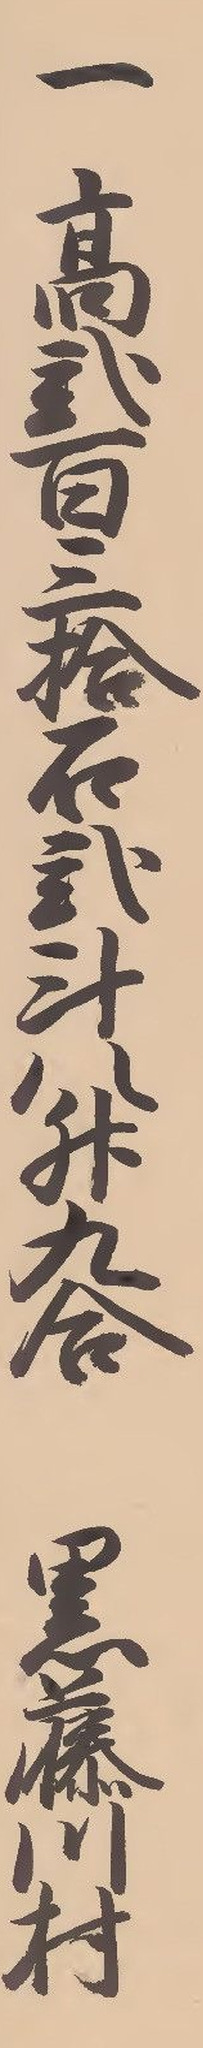一高弐百三拾石弐斗八升九合黒藤川村
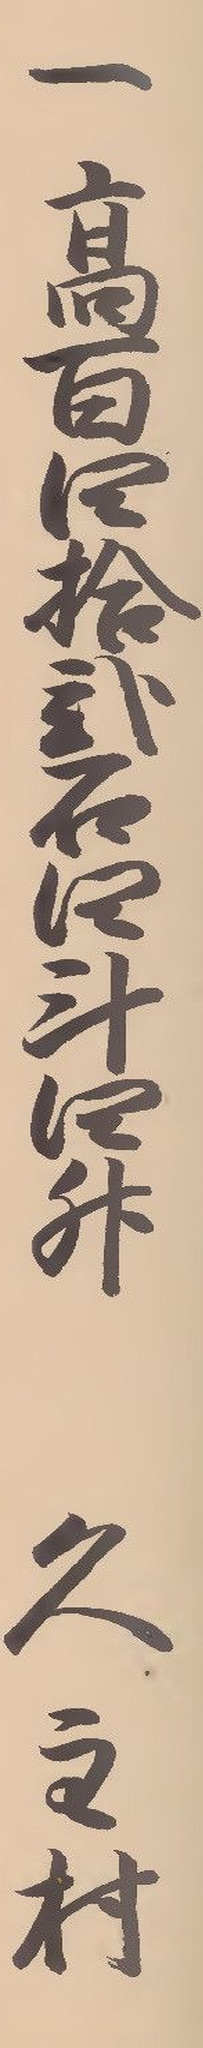一高百四拾弐石四斗四升久主村
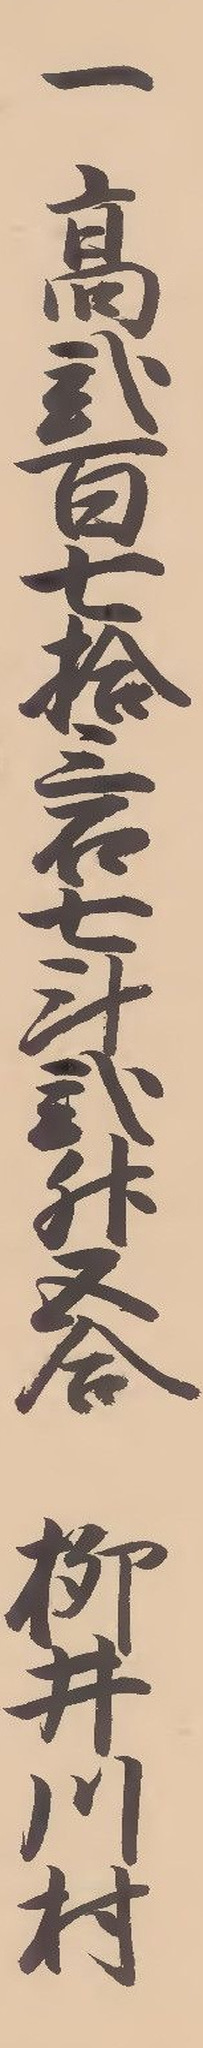一高弐百七拾三石七斗弐升五合柳井川村
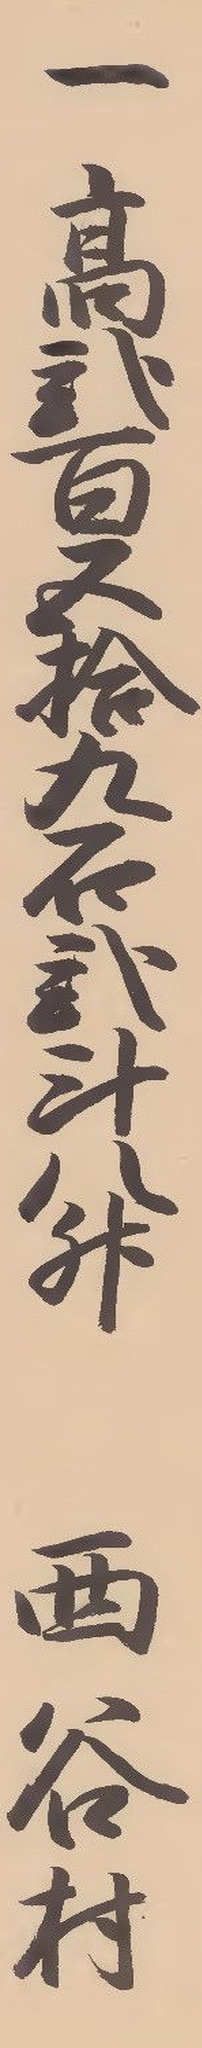一高弐百五拾九石弐斗八升西谷村
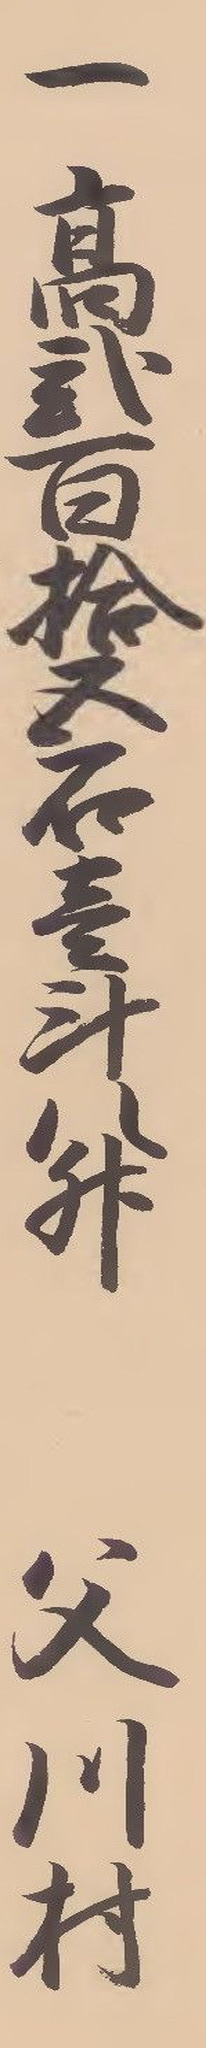一高弐百拾五石壱斗八升父川村

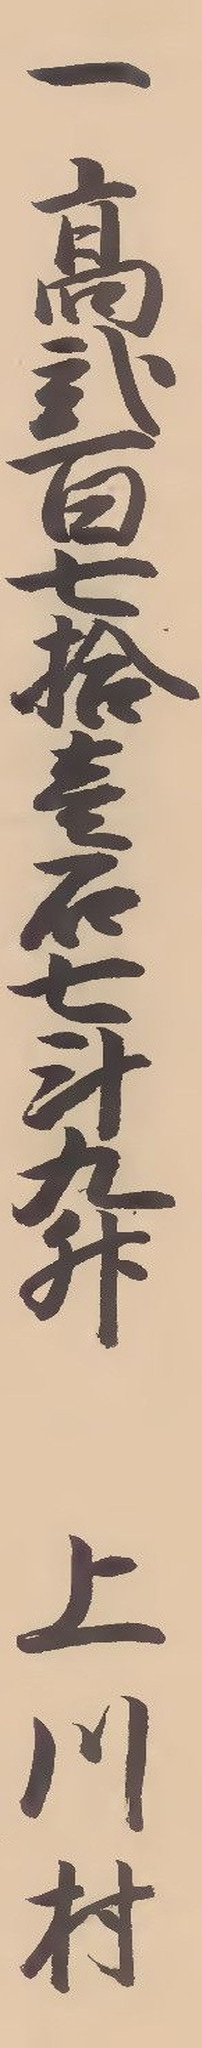一高弐百七拾壱石七斗九升上川村
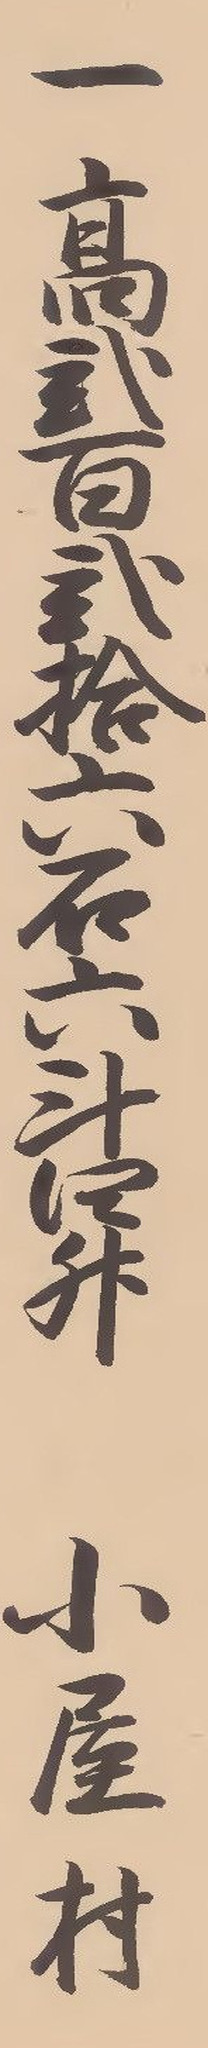一高弐百弐拾六石六斗四升小屋村
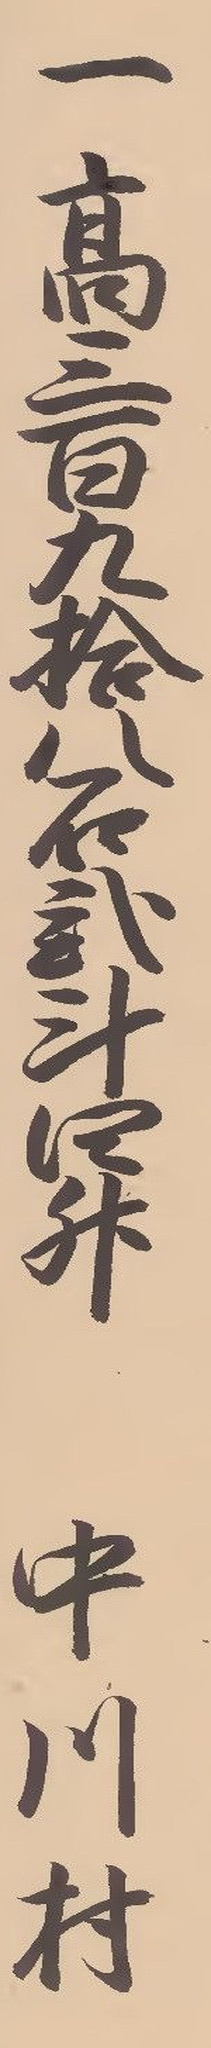一高三百九拾八石弐斗四升中川村
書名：伊予国郷帳
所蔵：国立公文書館 National Archives of Japan
